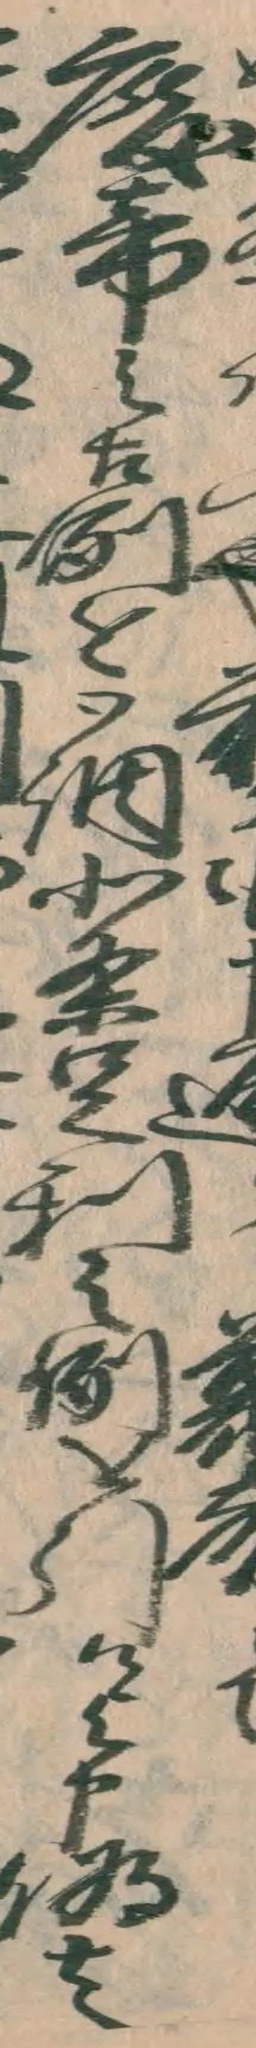廃帝之古例を御調北条足利之例を引候と申偽者
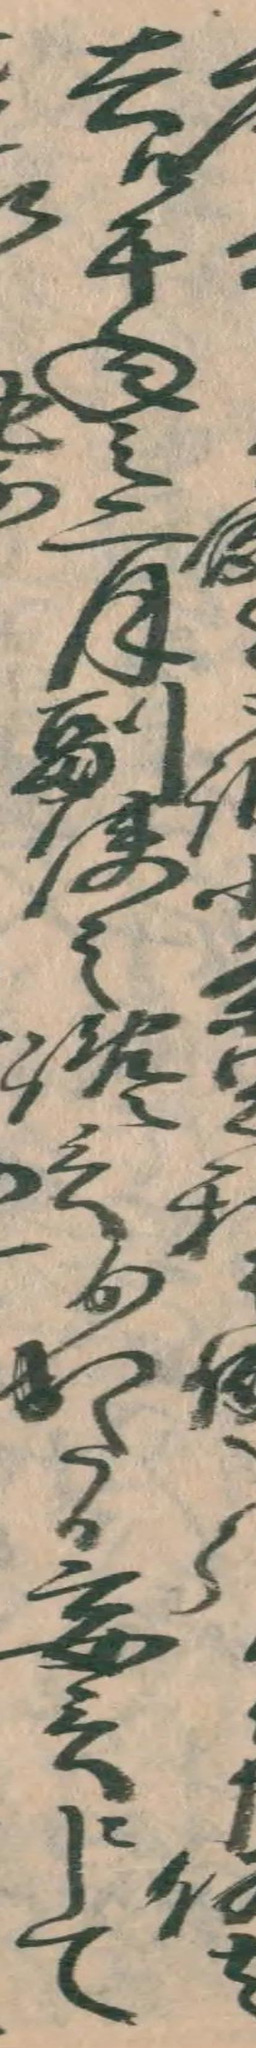去ル午年之二月副使之讒言ゟ出たる妄言にして
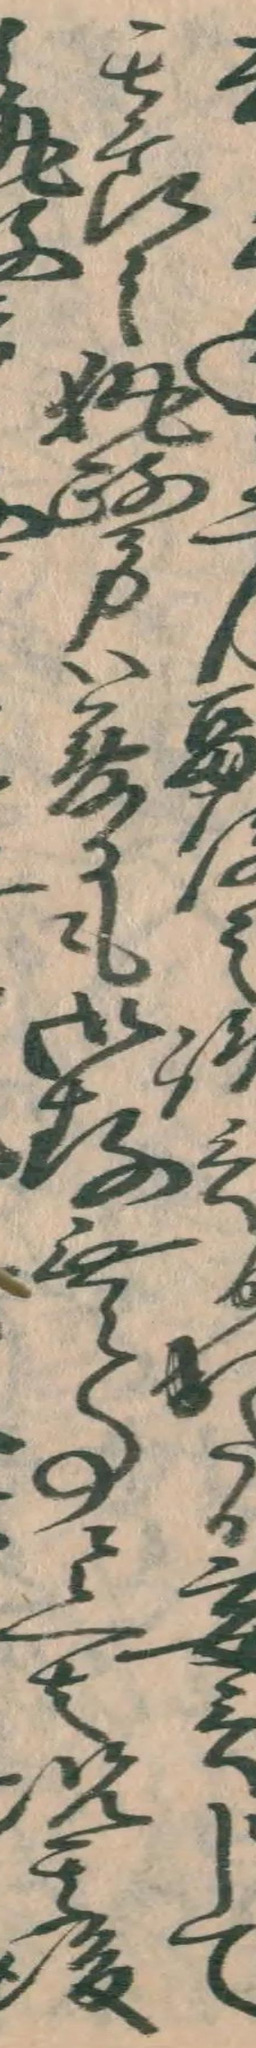其節之執政方ハ夢にも御存無之事ニ候へ者况其後
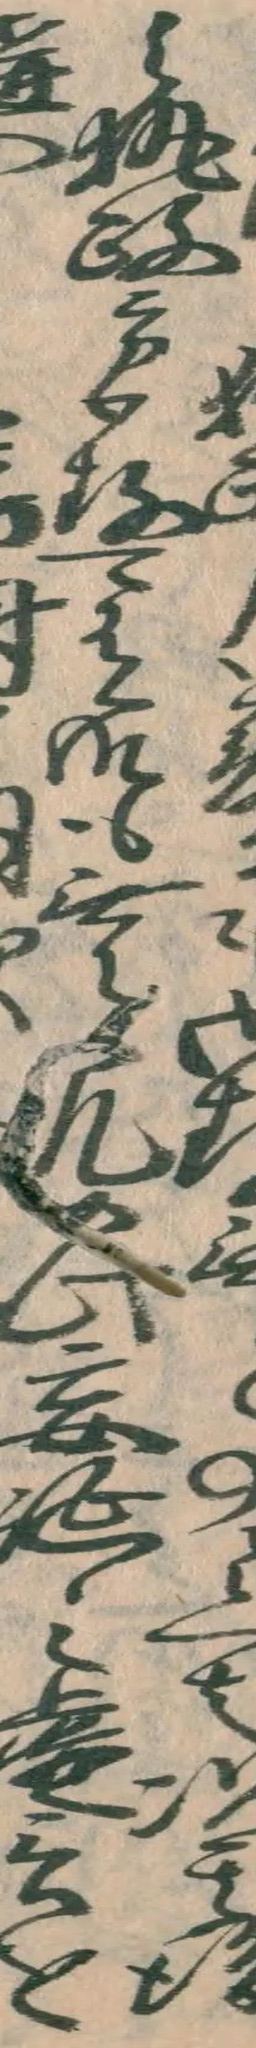之執政方も存可有様も無之候凡如此妄誕之虚言を
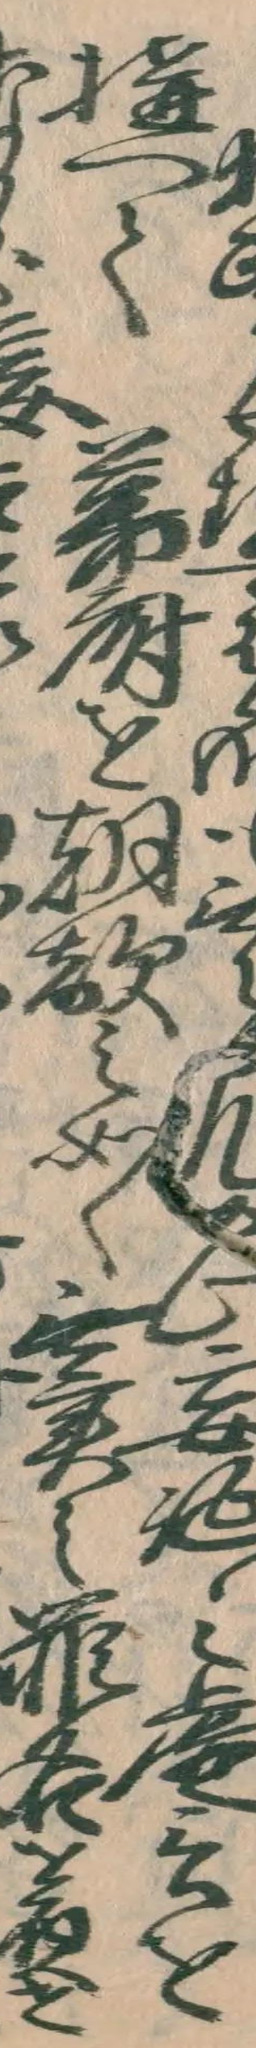構へて幕府を朝敵之如く無実之罪名を負せ
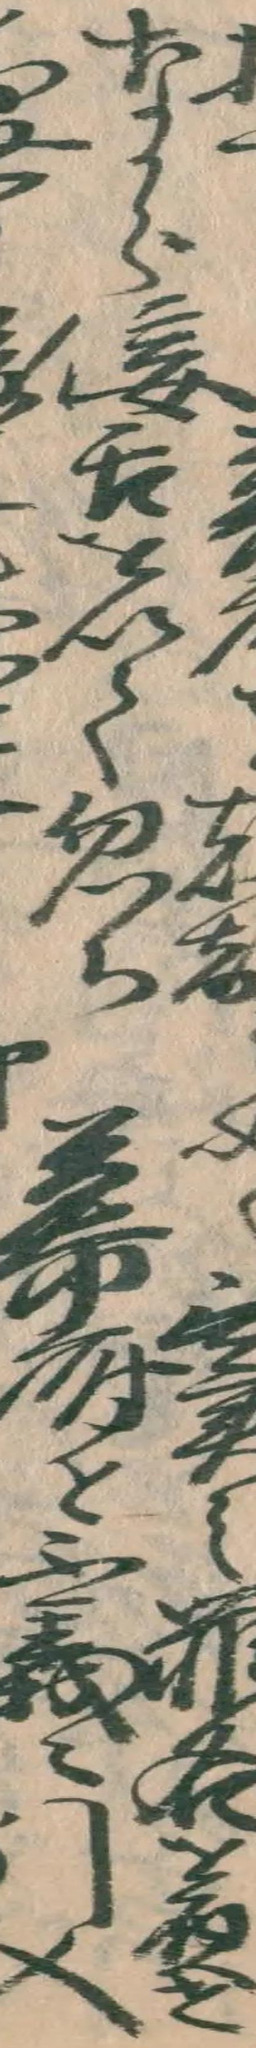なから佞舌を以て忽ち幕府を不義ニ引入
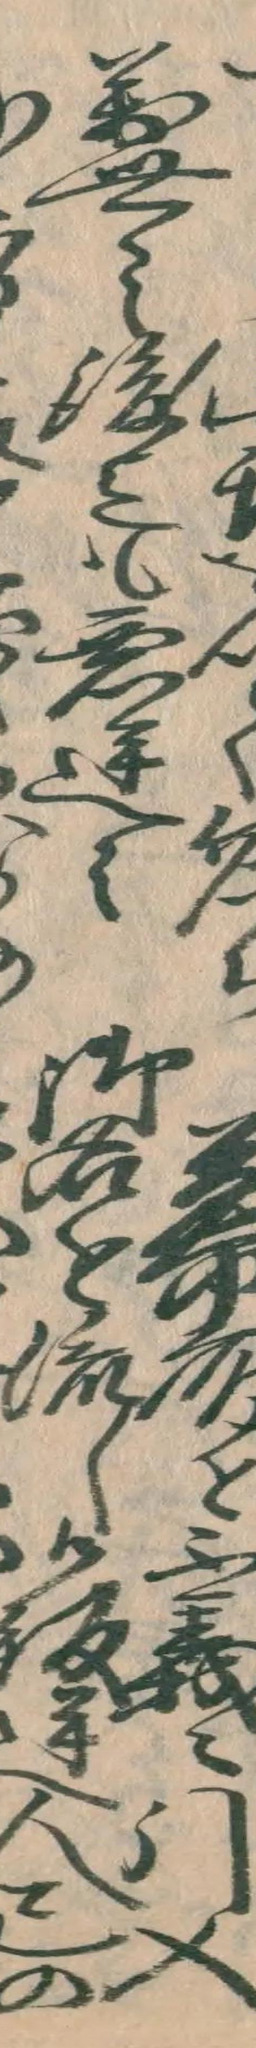萬世之後迄も悪逆之御名を流し候叛逆人己の
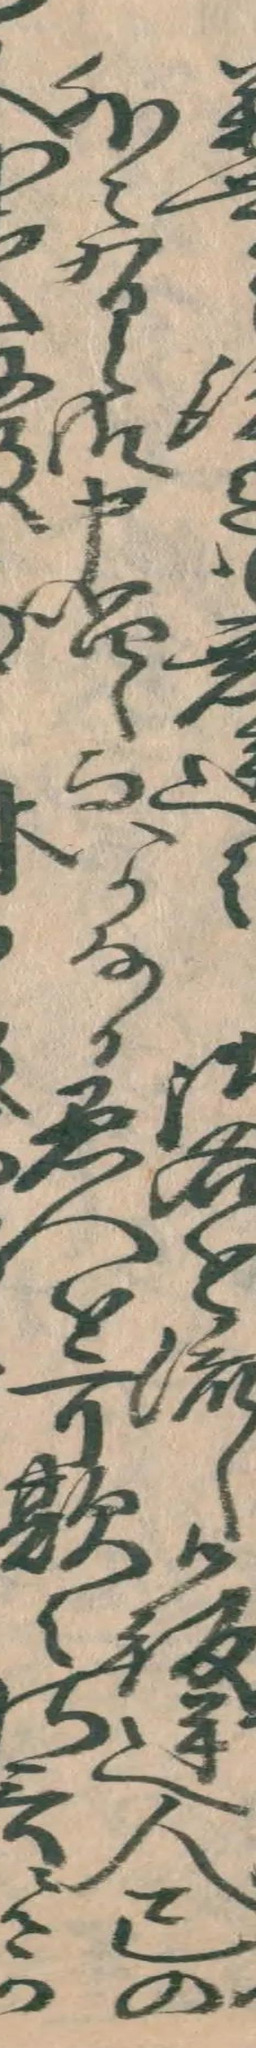外ニ有之様申唱候而いかなる悪人を可欺之巧言二候か
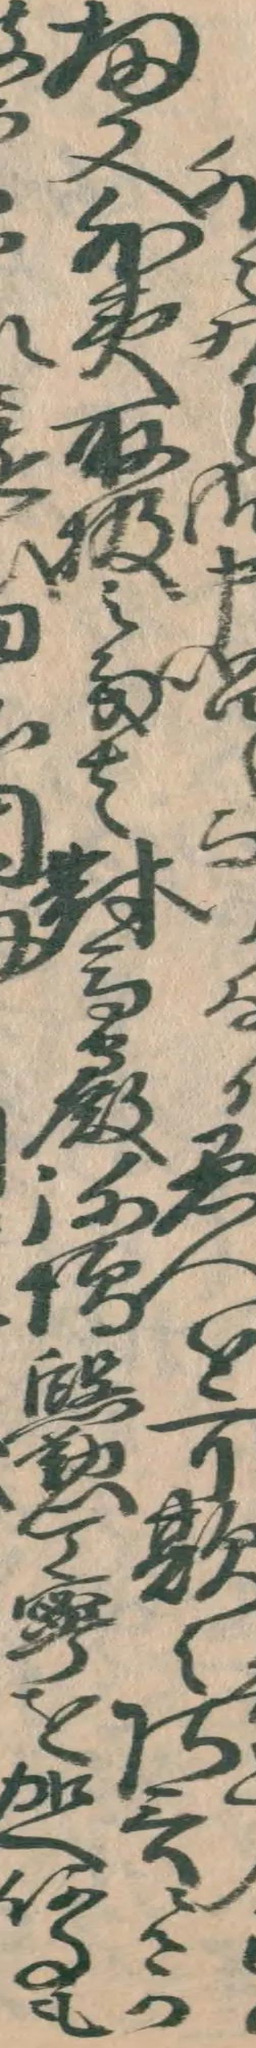扠又外夷取扱之義者對馬守殿弥増慇懃丁寧を加へ何事も
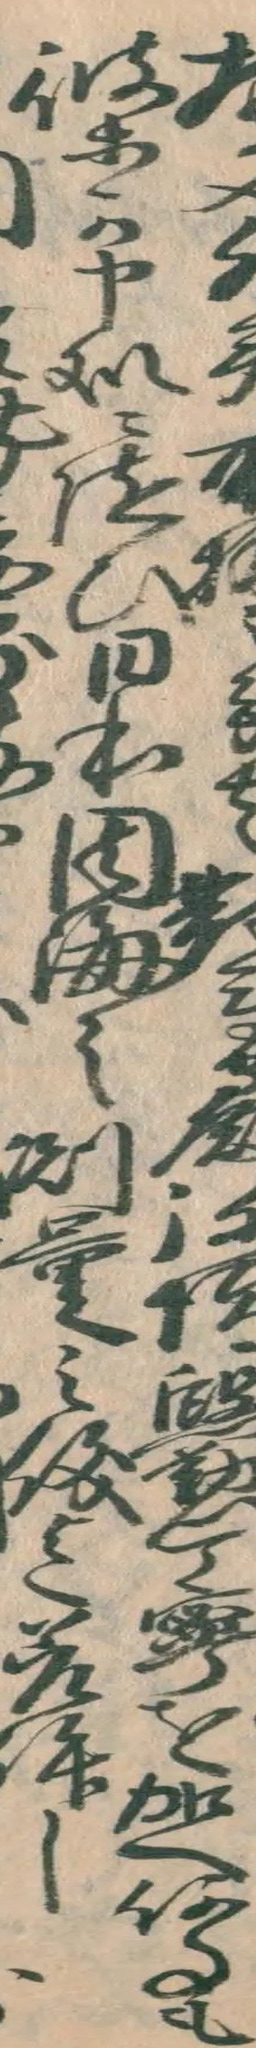彼等か申処ニ随ひ日本周海之測量之儀迄差許し
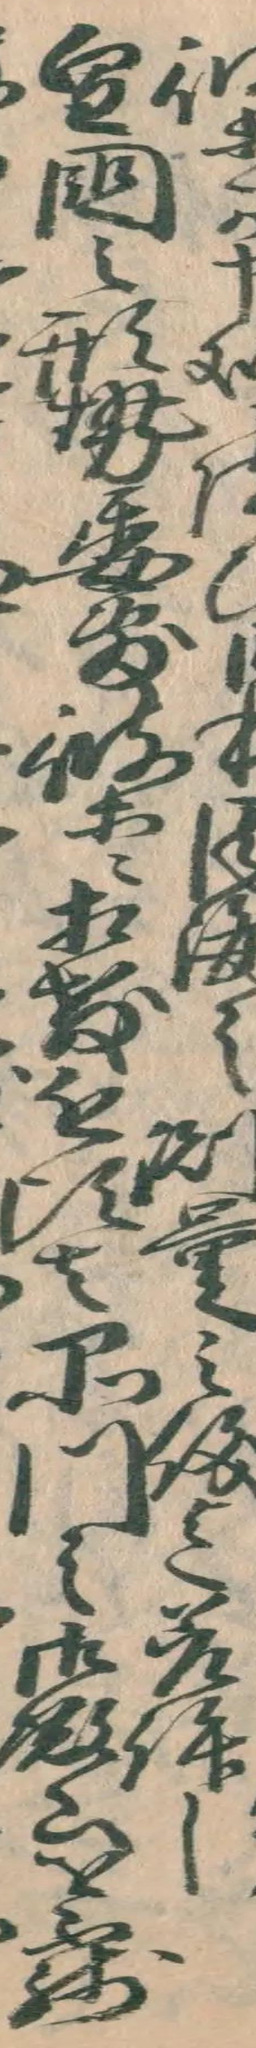皇国之形勢委敷彼等ニ相教近頃者品川之御殿山を不残
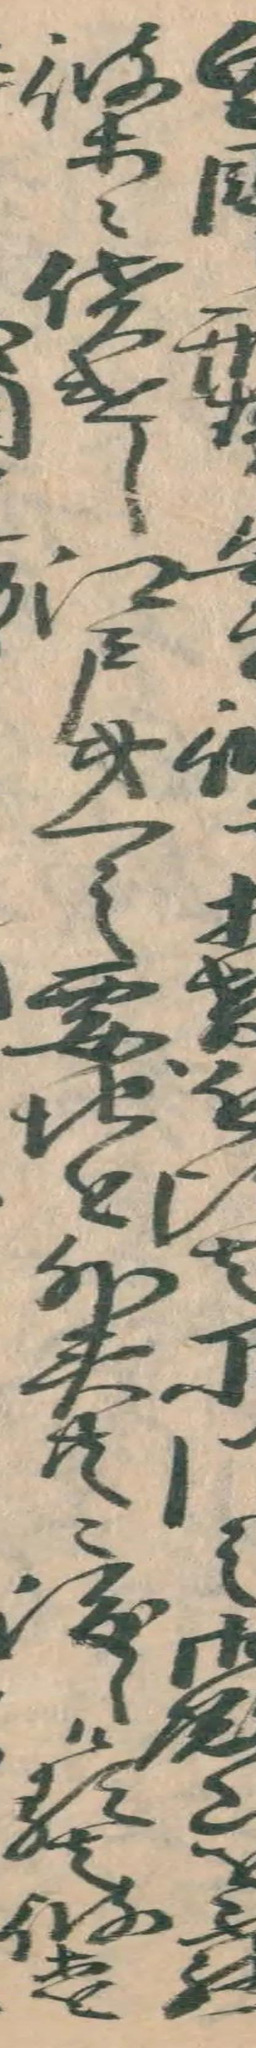彼等ニ貸遣し江戸第一之要地を外夷共ニ渡し候類者彼等を
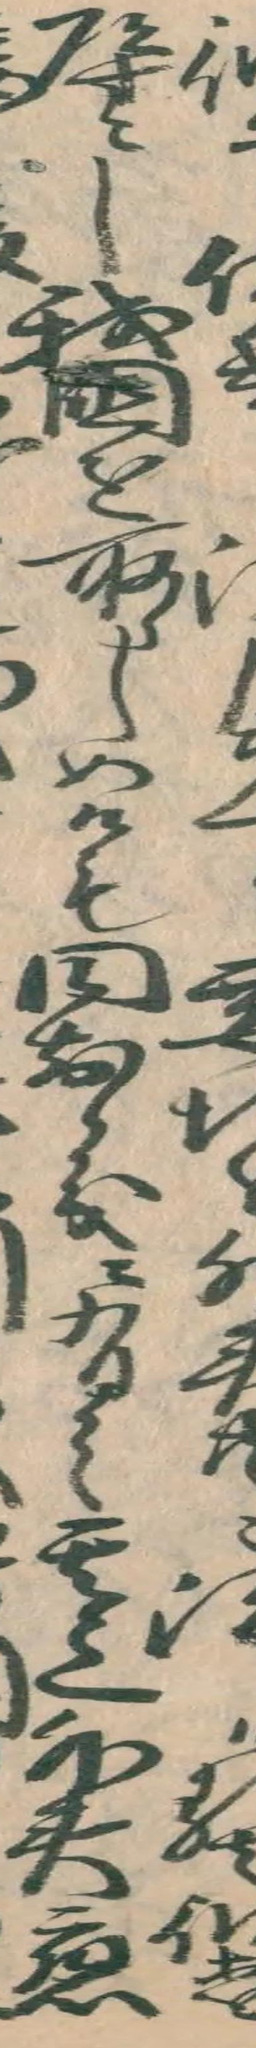導ニし我国を取らしめ候も同前之義ニ有之其上外夷應
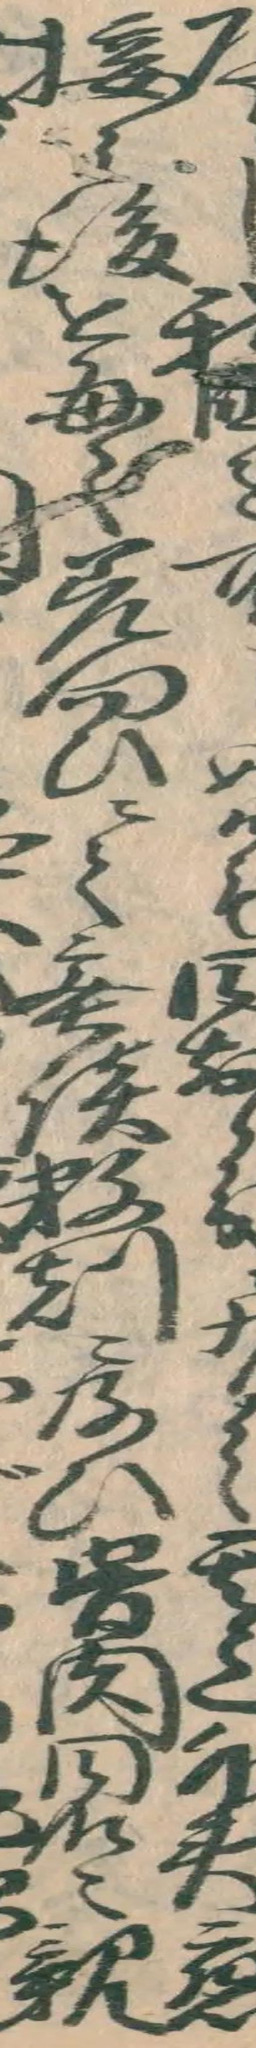接之後を毎々差向ひ二て密談数刻ニ及ひ骨肉同様ニ親
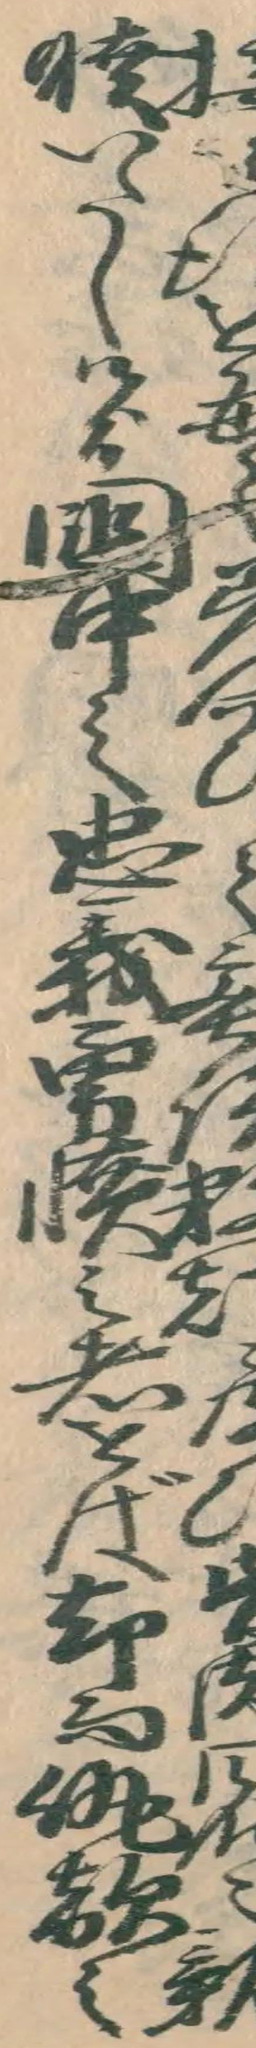睦いたし候旨国中之忠義勇憤之者をば却而仇敵之

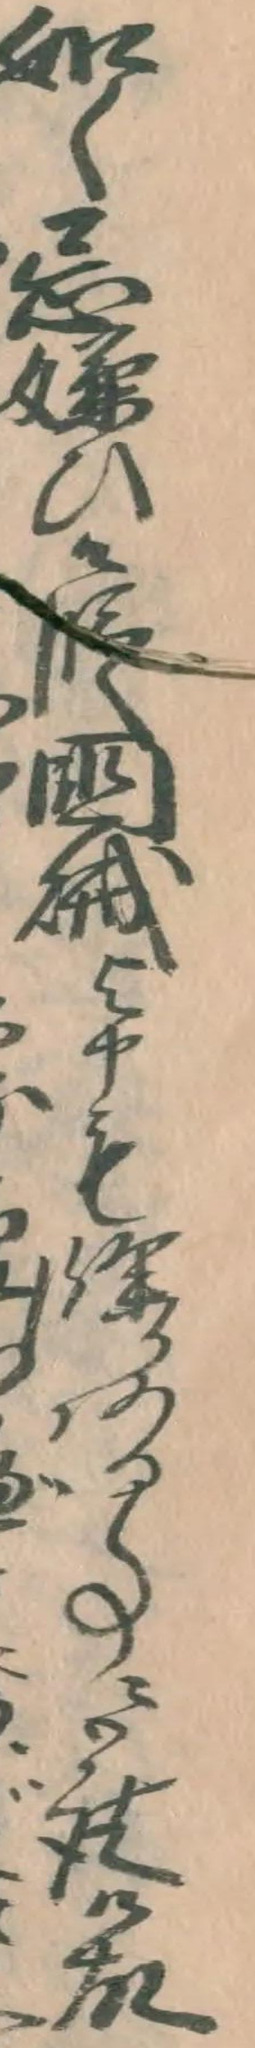如く忌嫌ひ候段国賊と申も餘りある事ニ御座候故
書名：麗斎叢書. 20
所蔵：国立国会図書館 National Diet Library, JAPAN
